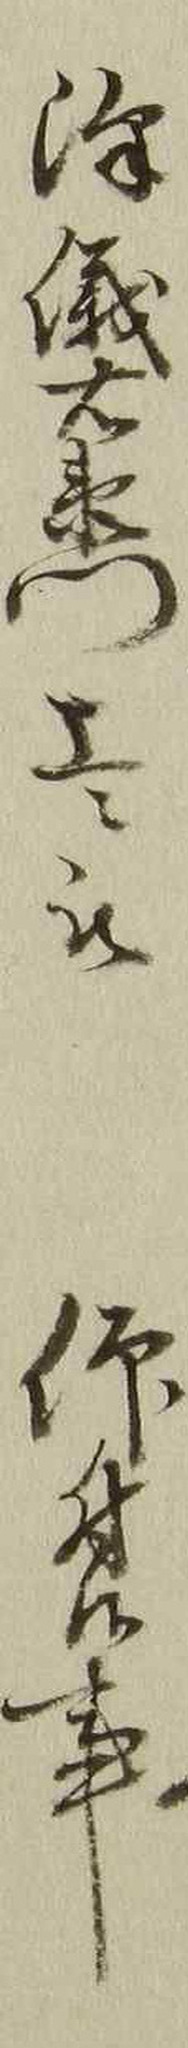沢儀右衛門上ニ被仰付候事
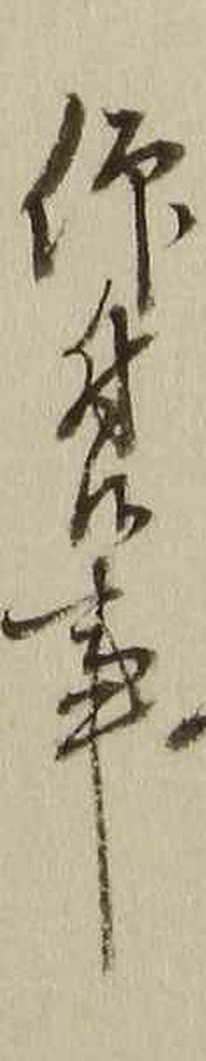仰出候事
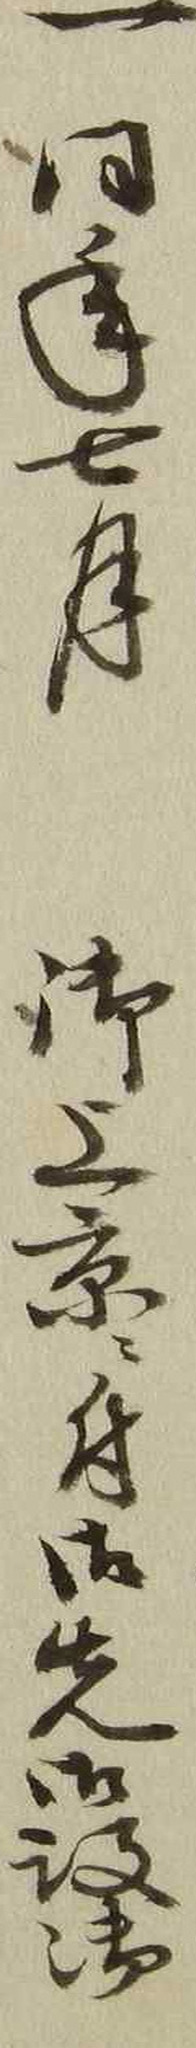一同年七月御上京ニ付御先御役御
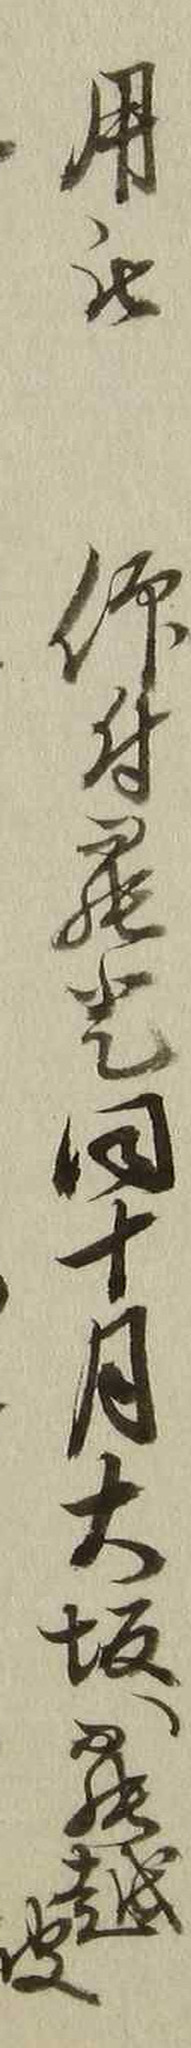用被仰付罷登同十月大阪へ罷越彼
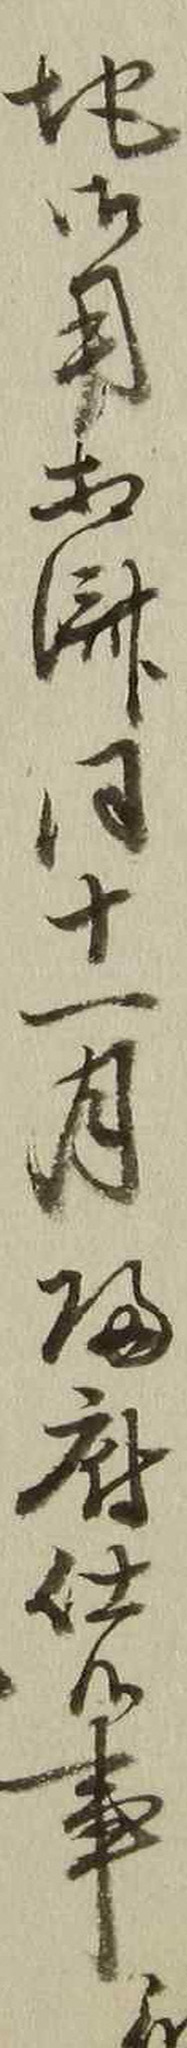地御用相済同十一月帰府仕候事
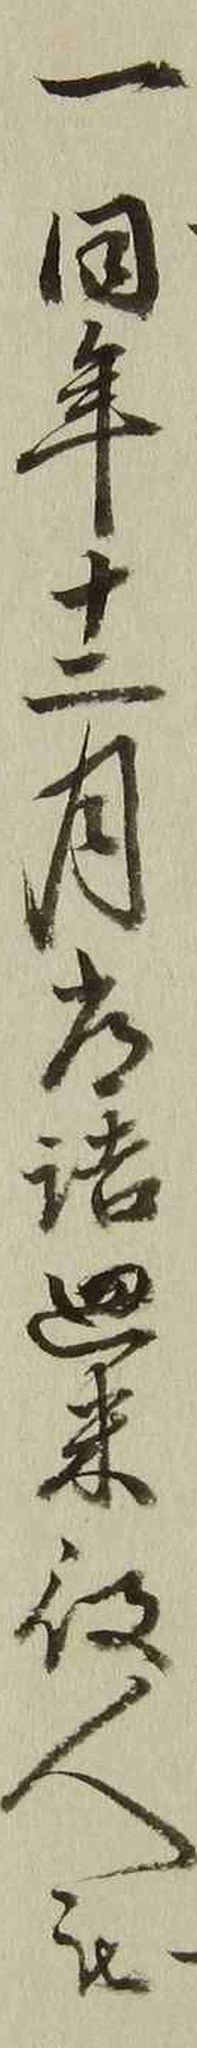一同年十二月常詰廻米役人被
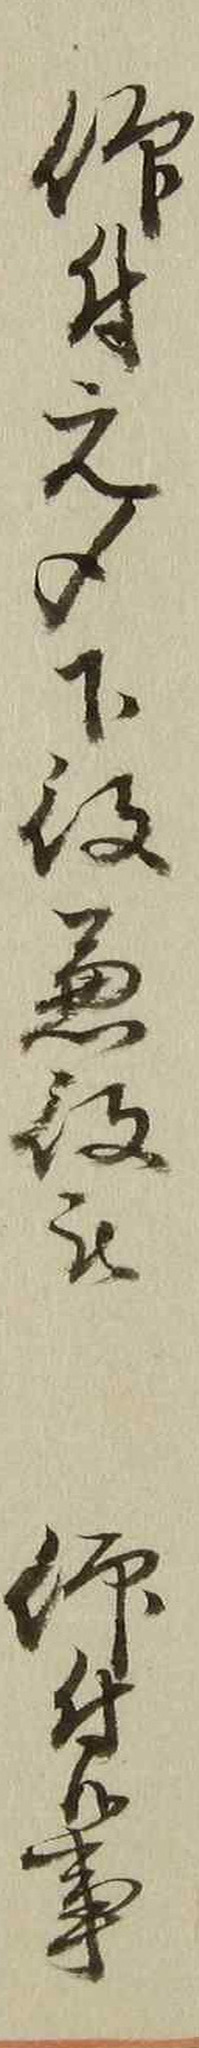仰付元〆下役兼役被仰付候事
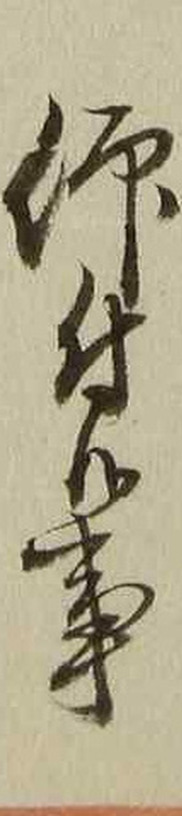仰出候事
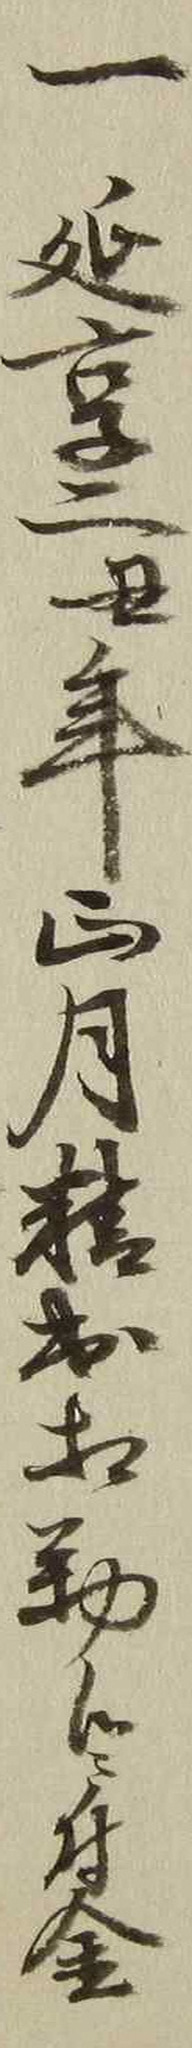一延享二丑年正月精出相勤候ニ付金
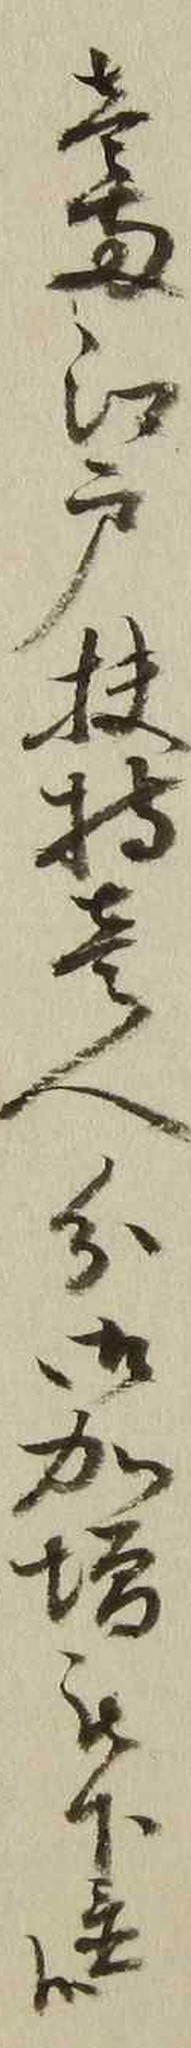壱両江戸扶持壱人分御加増被下置候
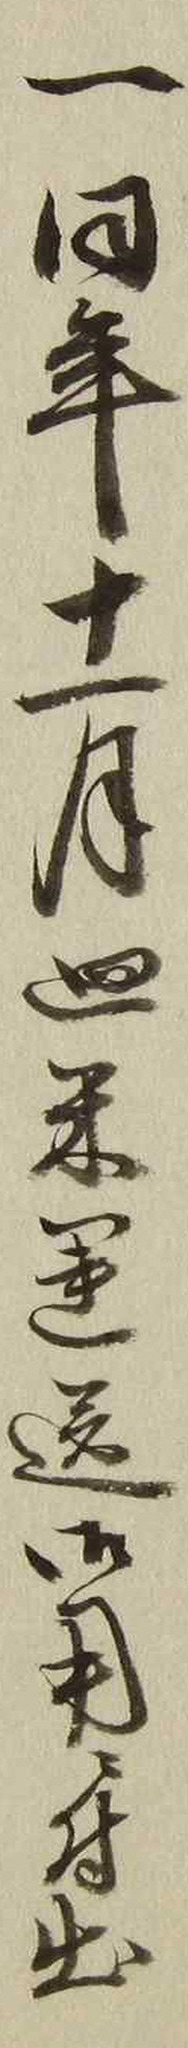一同年十一月廻米運送御用ニ付出
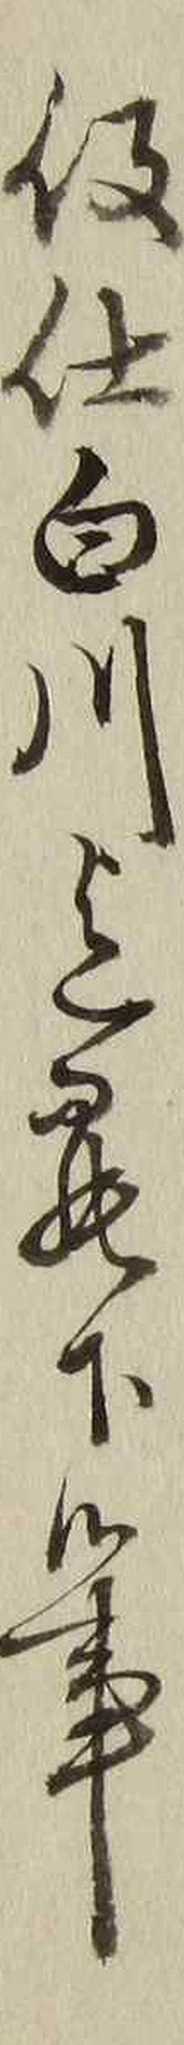役仕白川迄罷下候事
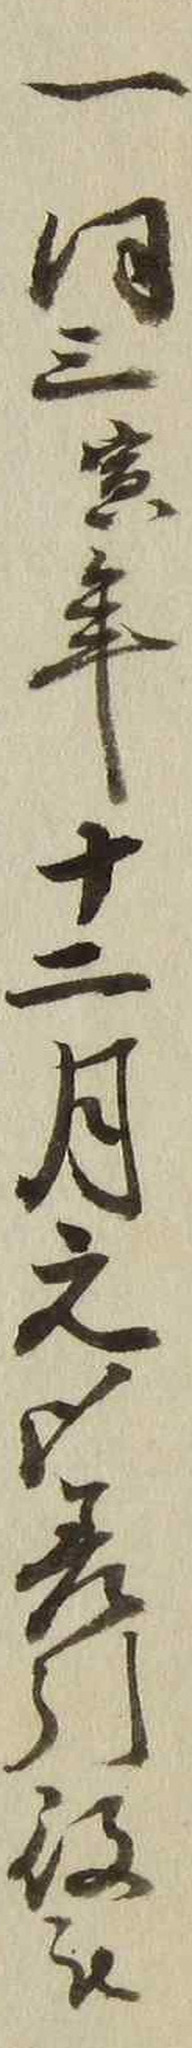一同三寅年十二月元〆差引役被
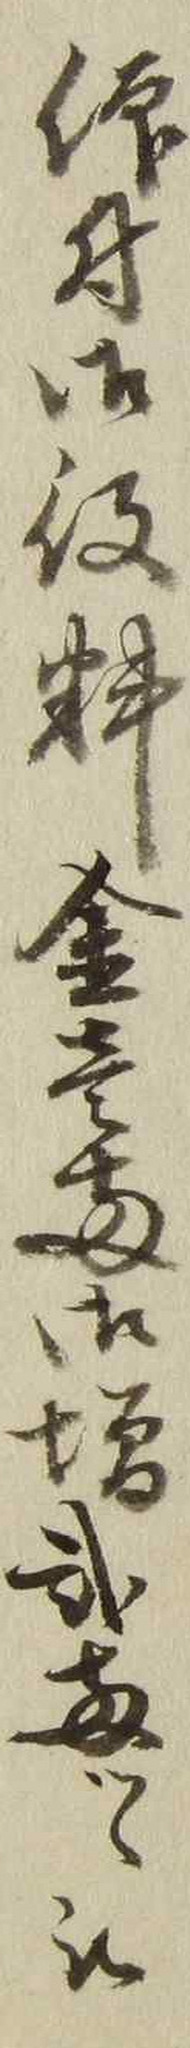仰付御役料金壱両御加増弐両ツヽ被
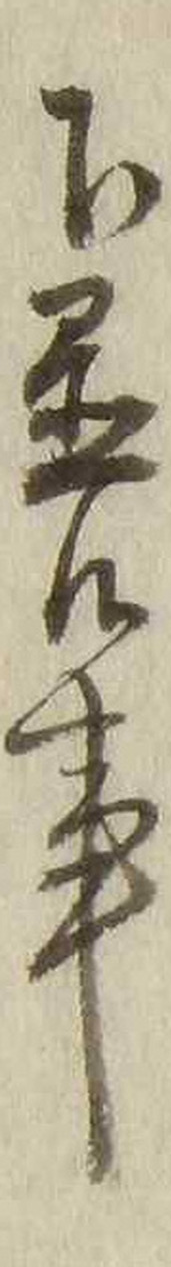下置候事
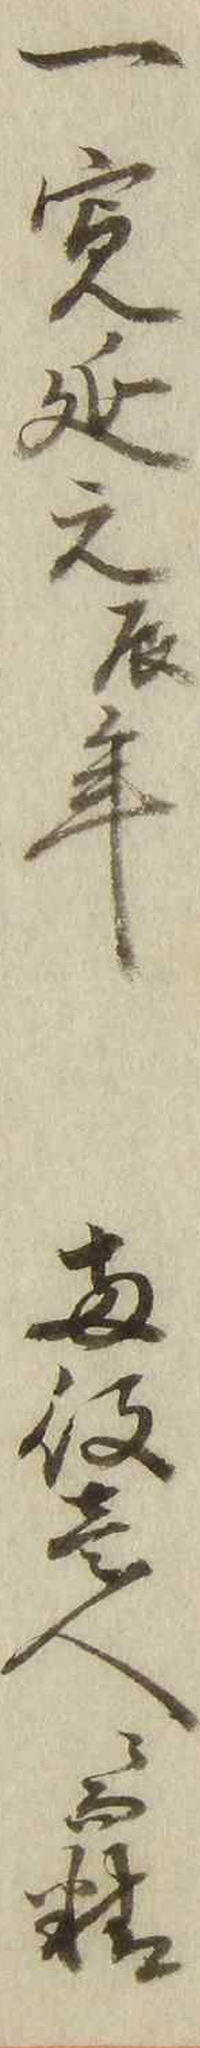一寛延元辰年両役壱人ニ而精
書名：諸士系譜　巻之53　に之部4
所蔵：会津若松市立会津図書館
